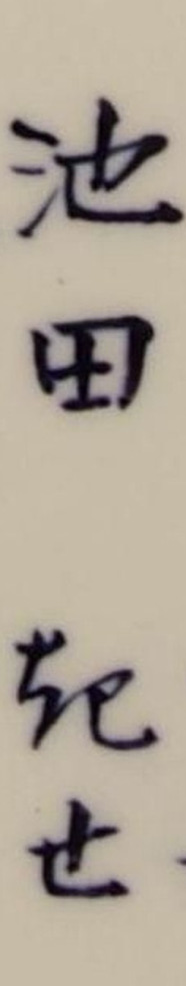池田きせ
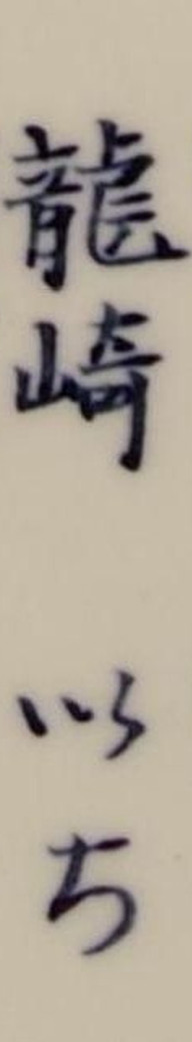龍崎いち
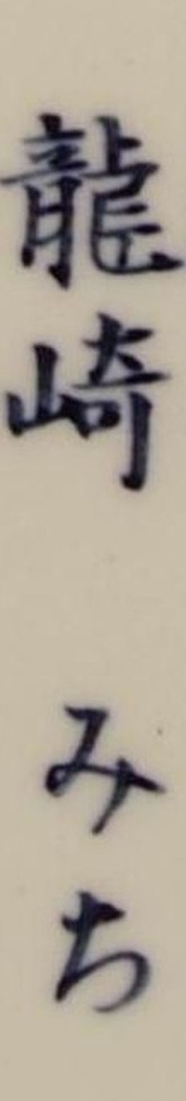龍崎みち
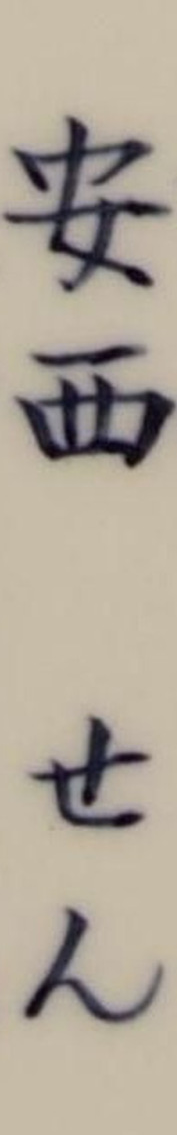安西せん
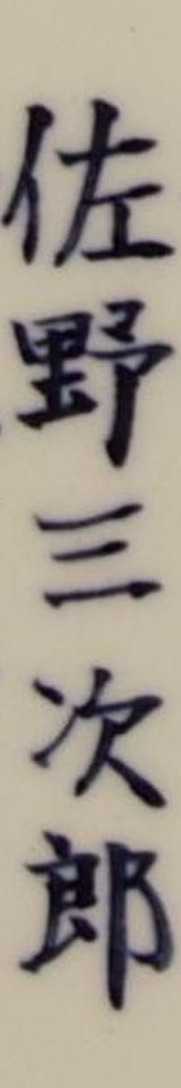佐野三次郎
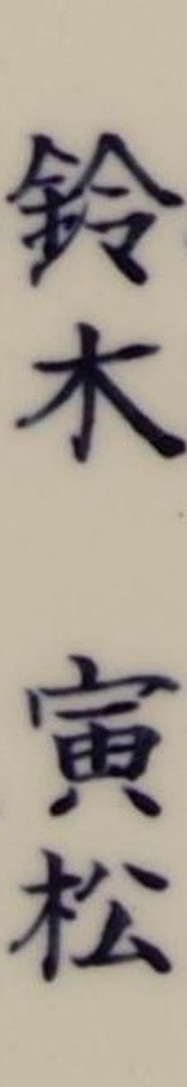鈴木寅松
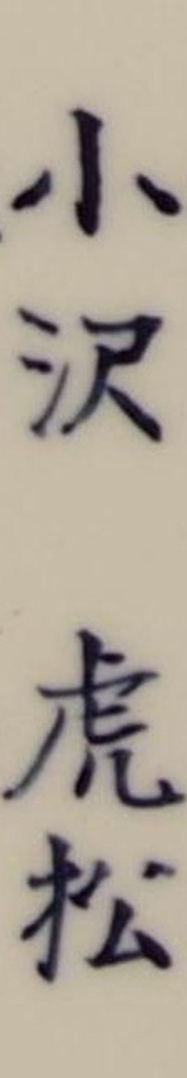小沢虎松
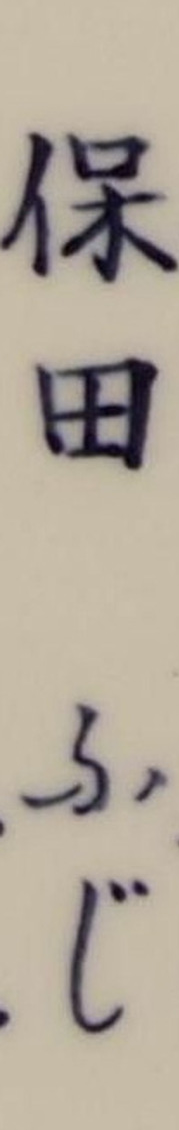保田ふじ
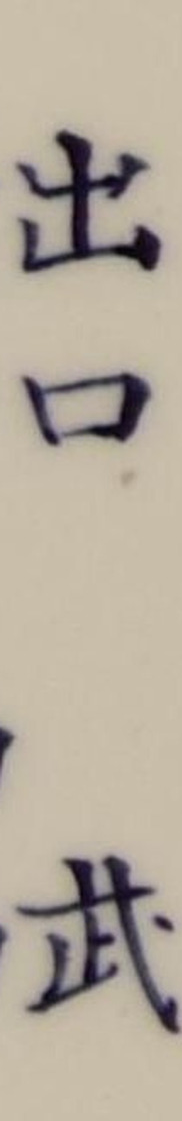出口武
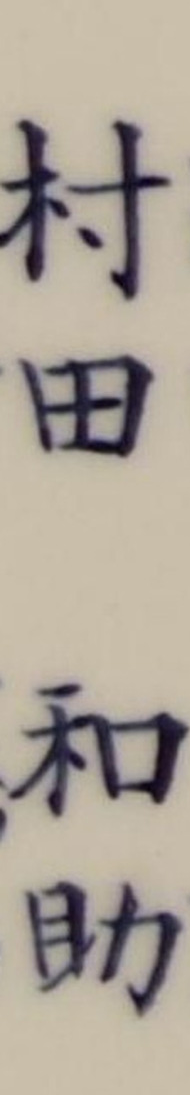村田和助
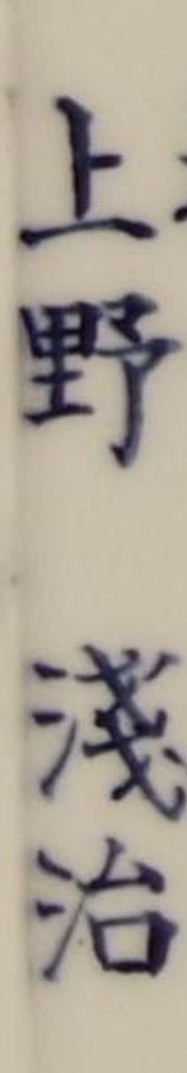上野浅治

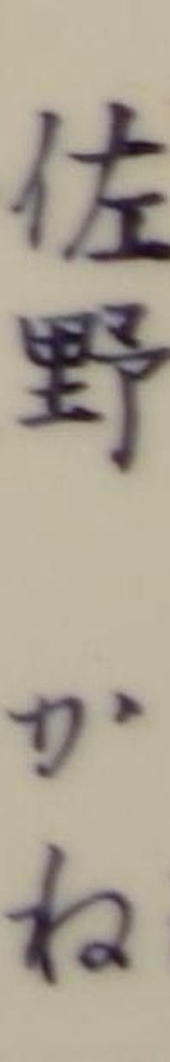佐野かね
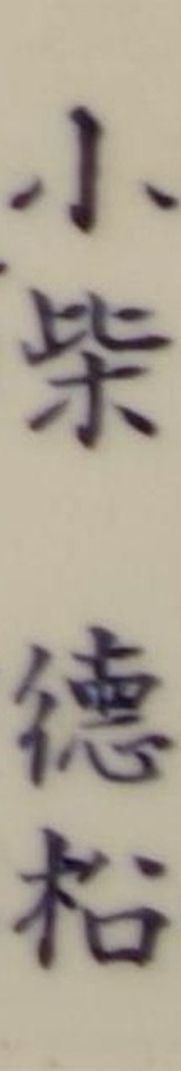小柴徳松
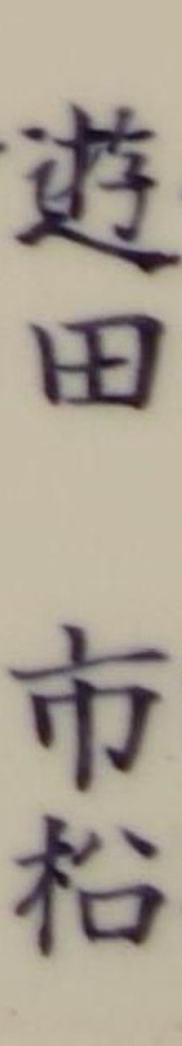遊田市松
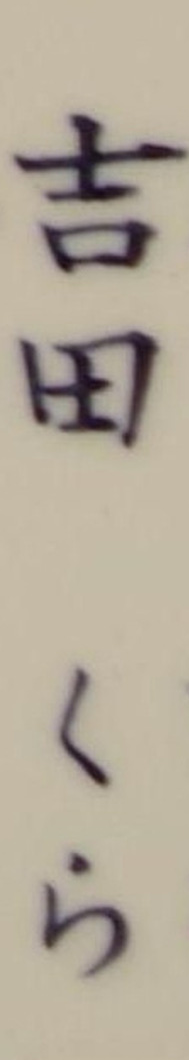吉田くら
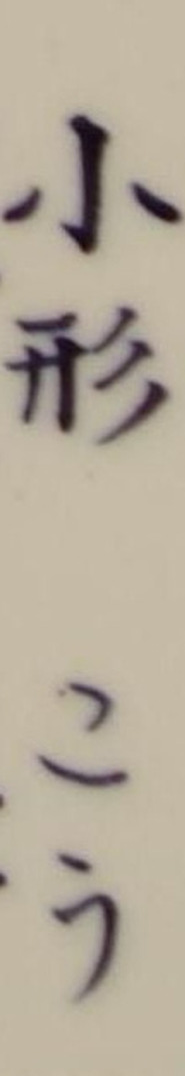小形こう
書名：M~S
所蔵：高野山金剛峯寺
